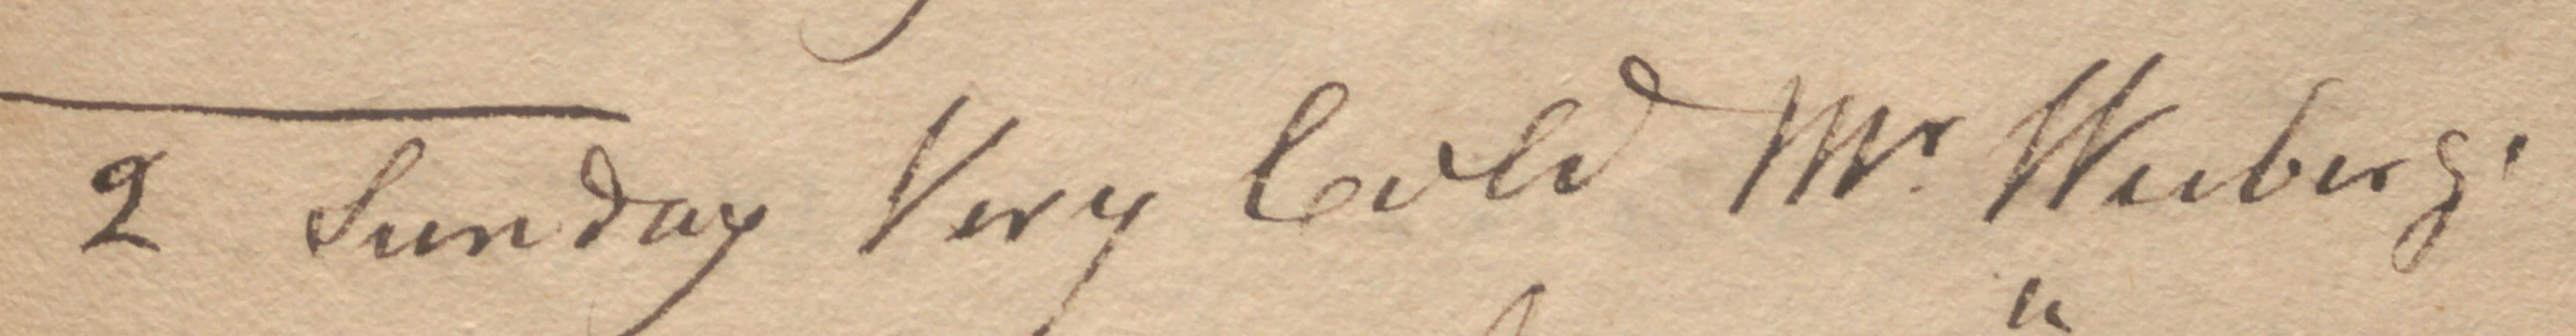2 Sunday Very Cold M^r. Weibergs
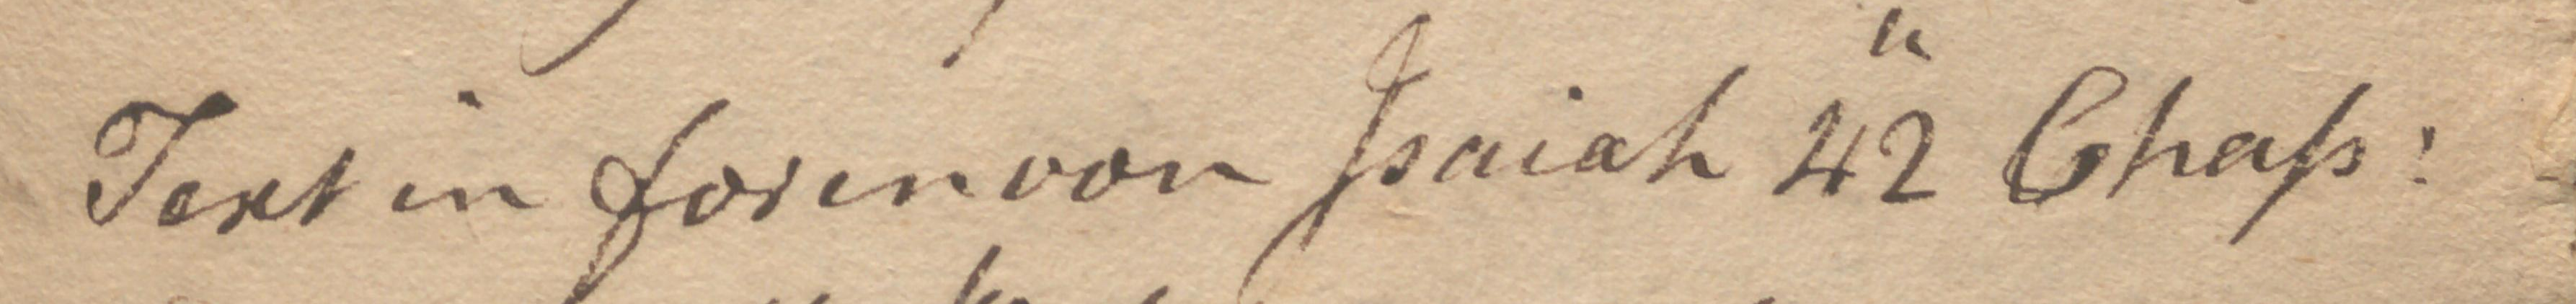Text in forenoon Isaiah 42^th Chap:
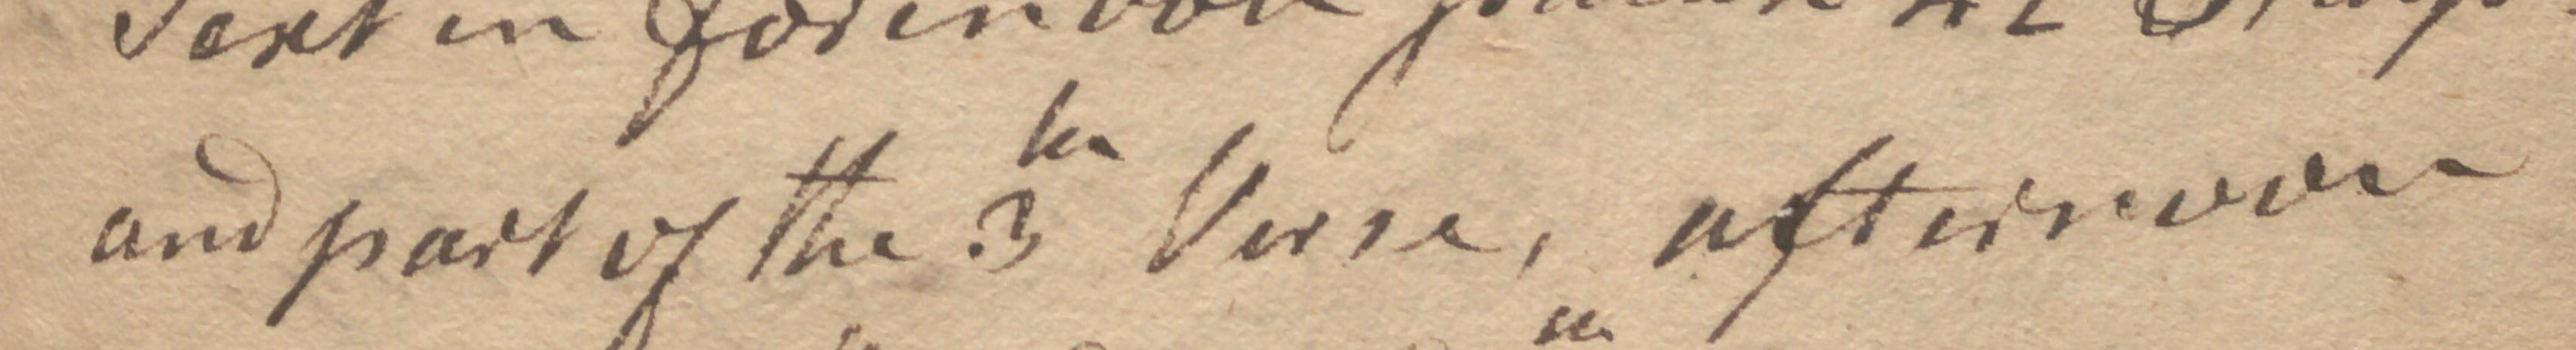and part of the 3^th Verse, afternoon
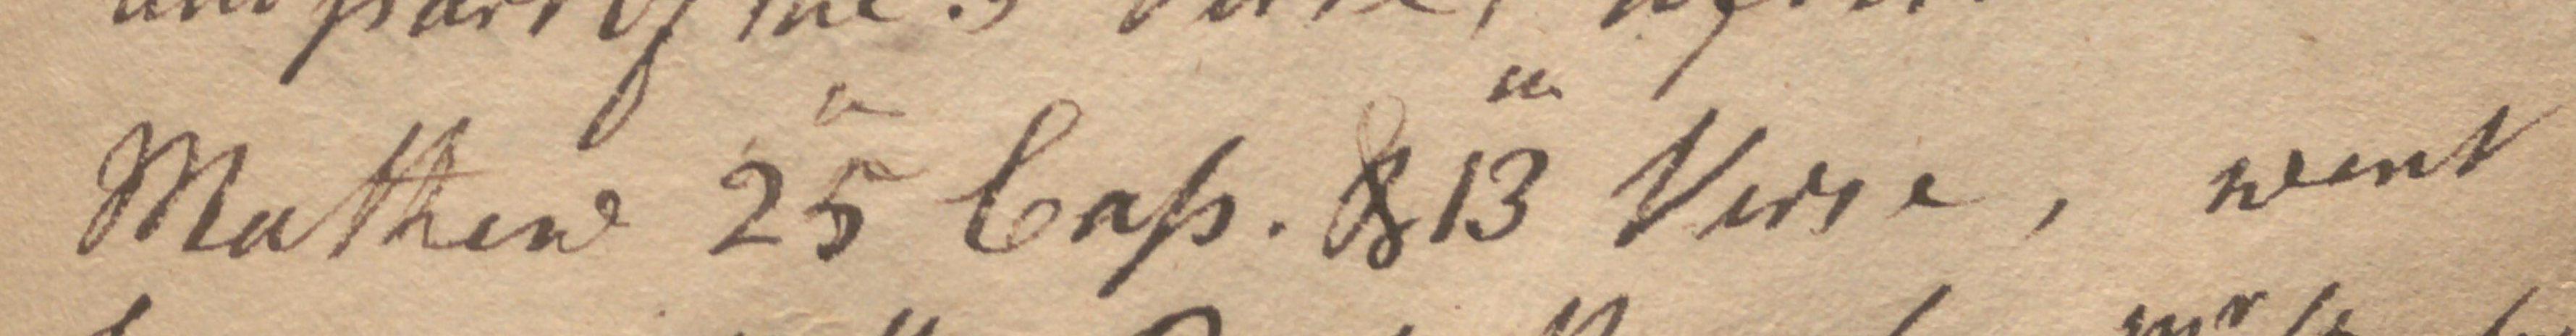Mathew 25^th Cap. & 13^th Verse, went
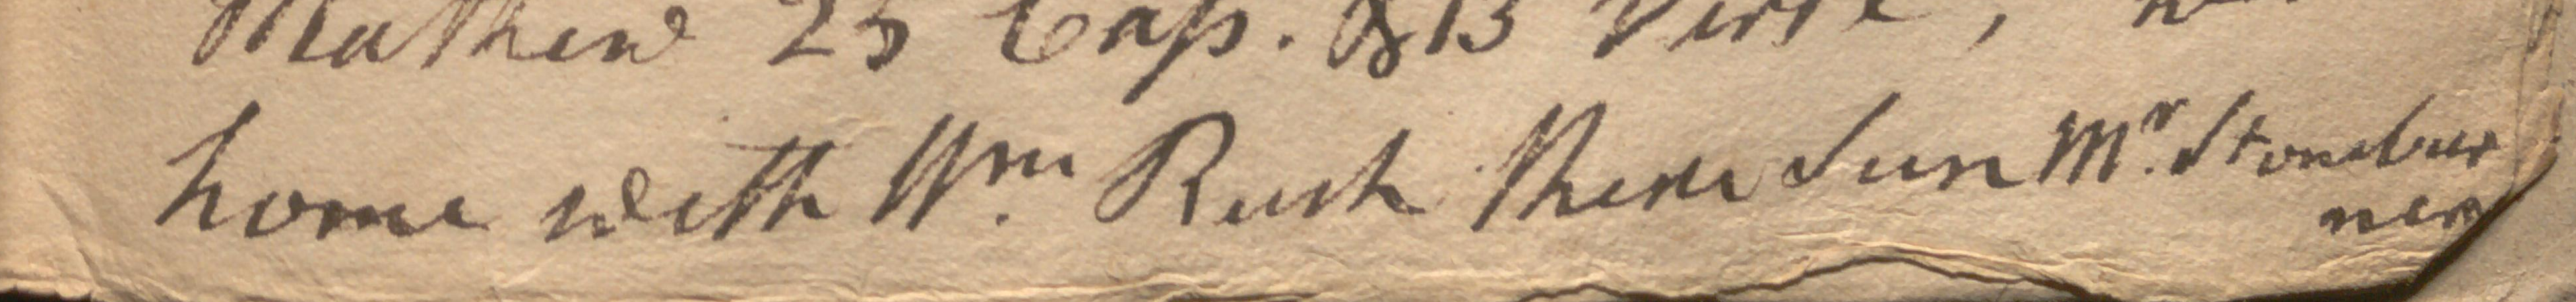home with W^m. Rush there Seen M^r Stonebur
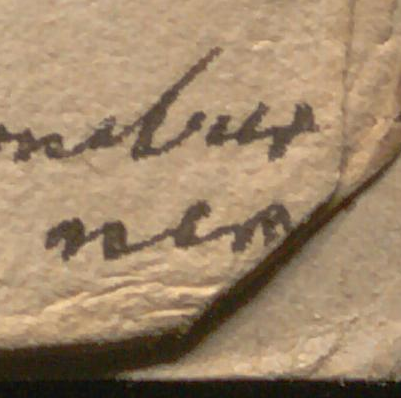ner
